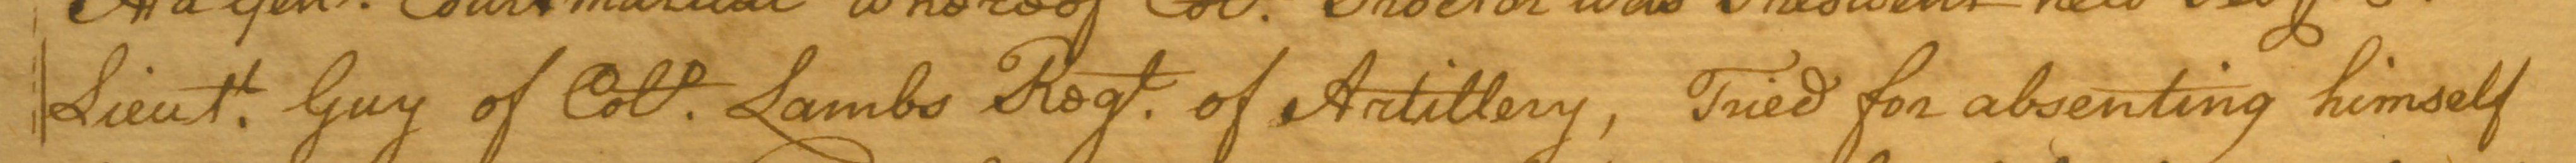Lieut^t. Guy of Col^o. Lambs Reg^t. of Artillery, Tried for absenting himself
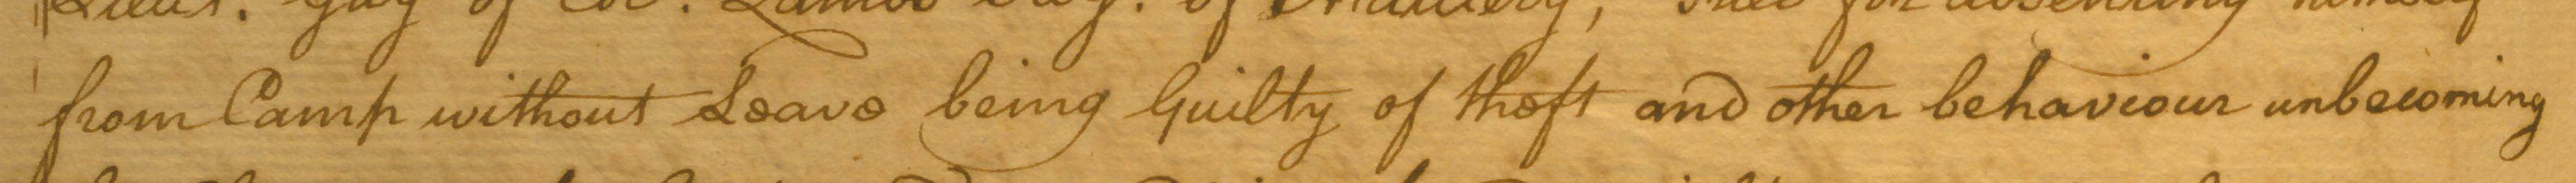from Camp without Leave being Guilty of theft and other behavior unbecoming
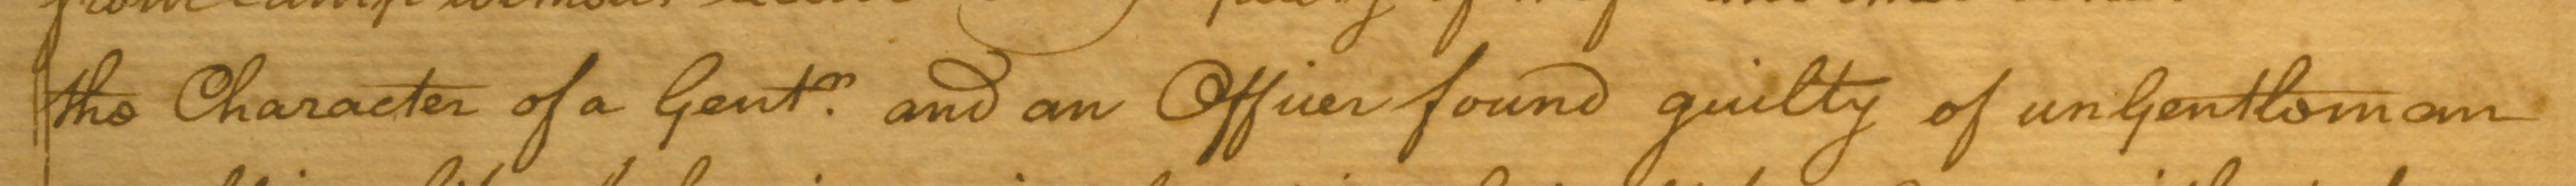the Character of a Gent^n. and an Officer found guilty of unGentleman
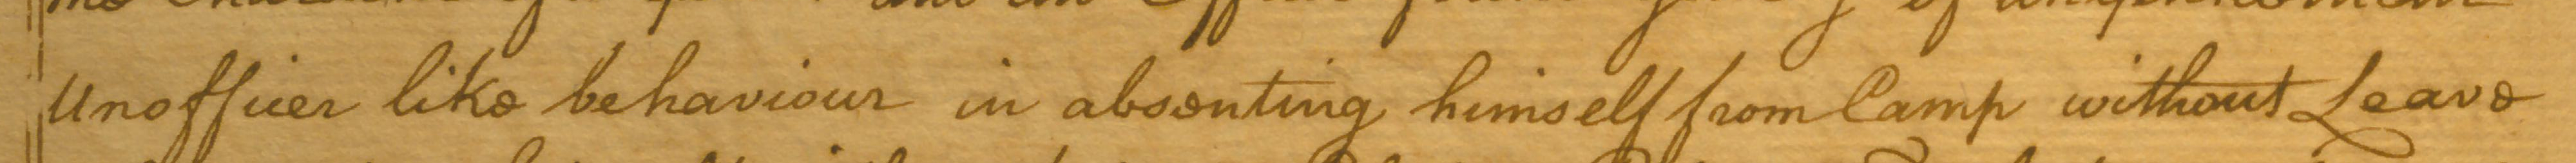Unofficer like behavior in absenting himself from Camp without Leave
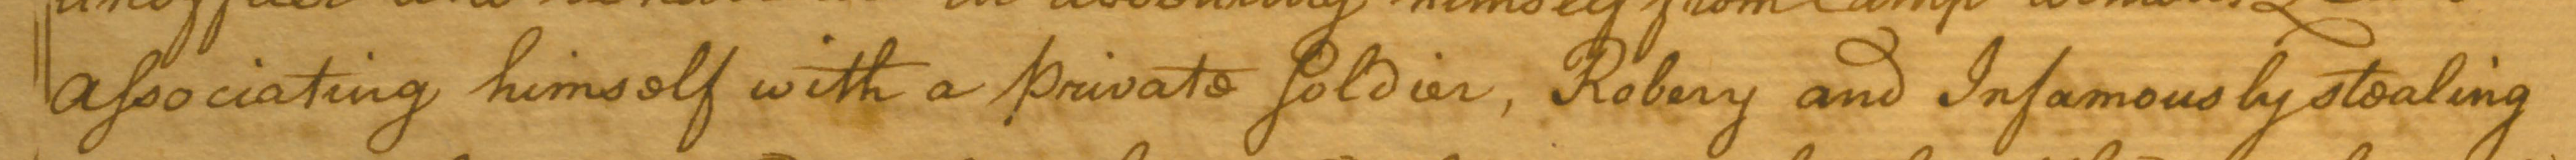associating himself with a private soldier, Robery and Infamously stealing
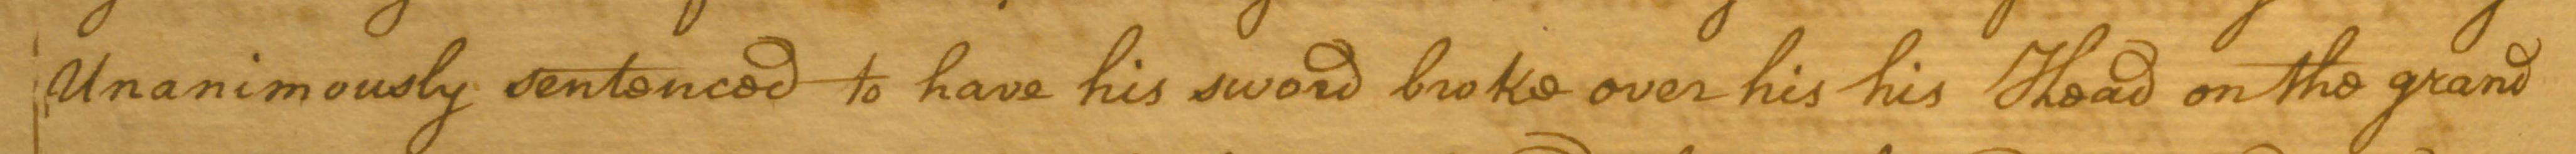Unanimously sentenced to have his sword broke over his his Head on the grand
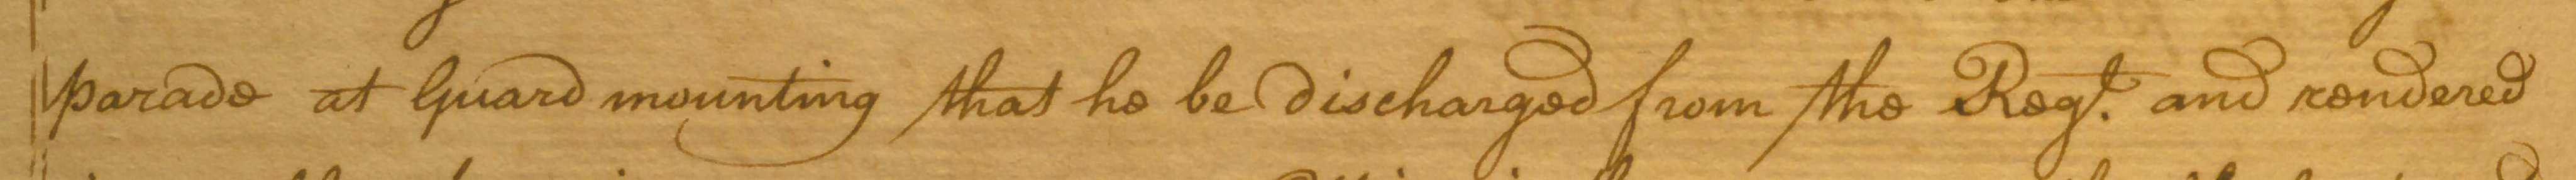parade at Guard mounting that he be discharged from the Reg^t. and rendered
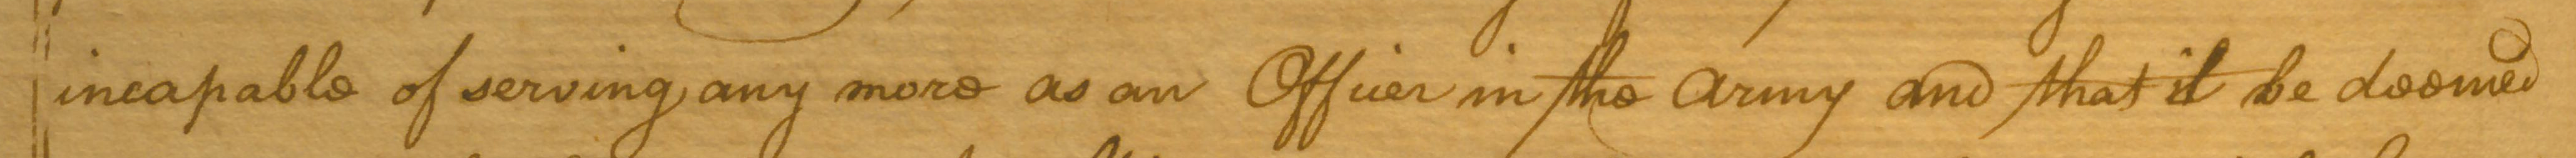incapable of serving any more as an Officer in the army and that it be deemed
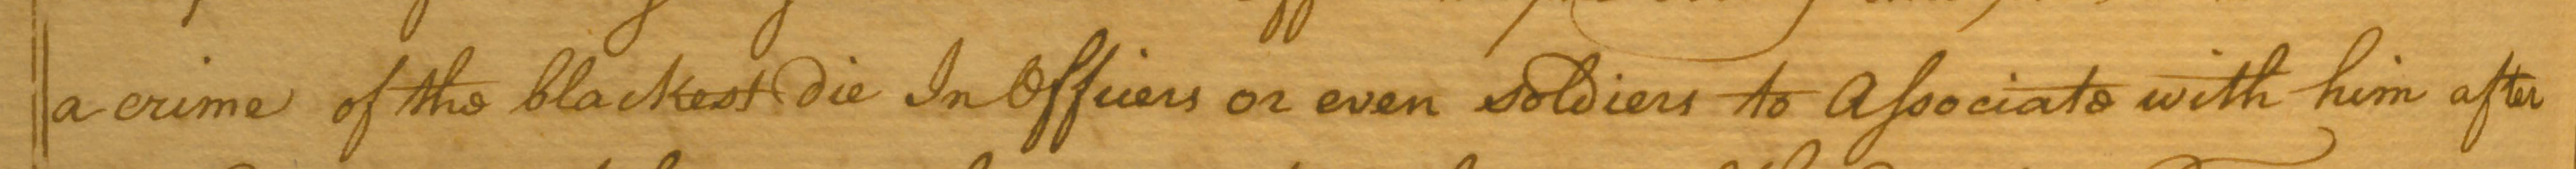a crime of the blackest die In Office or even soldiers to Associate with him after
